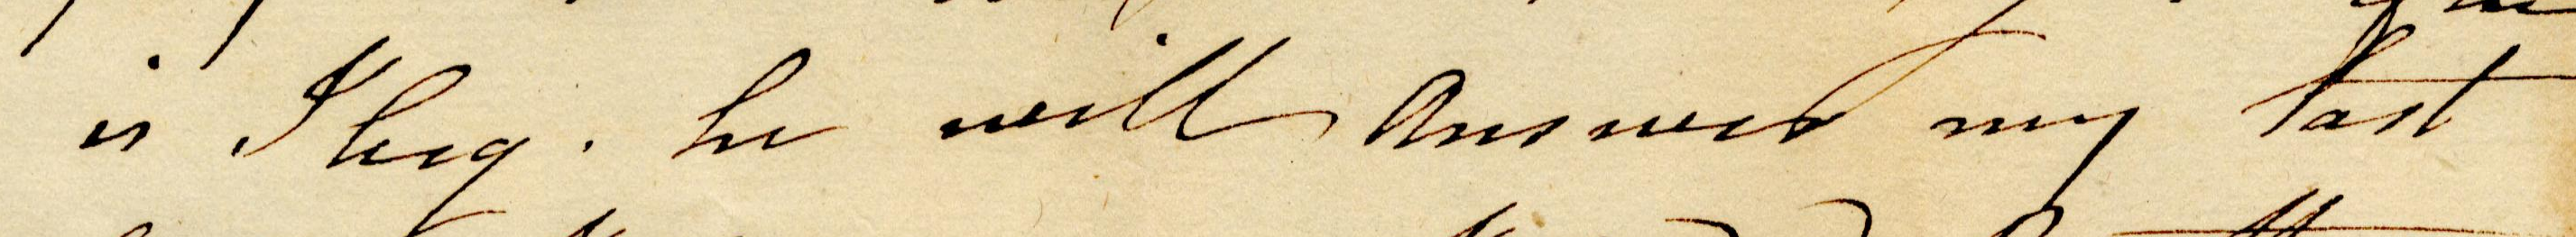is I beg. he will answer my last
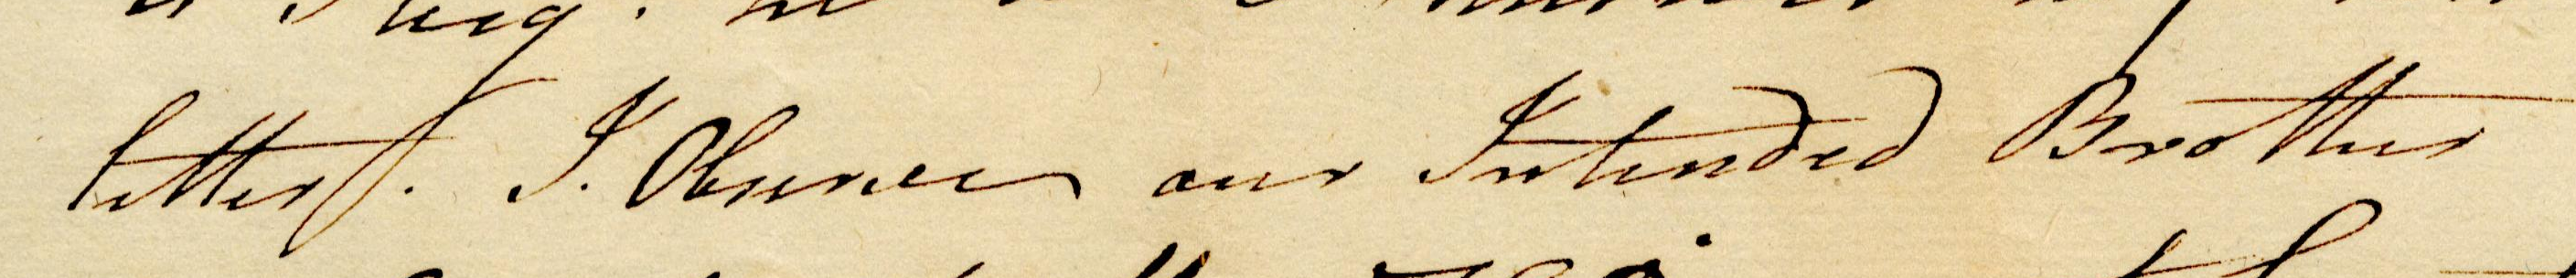letter. I Observe our Intended Brother
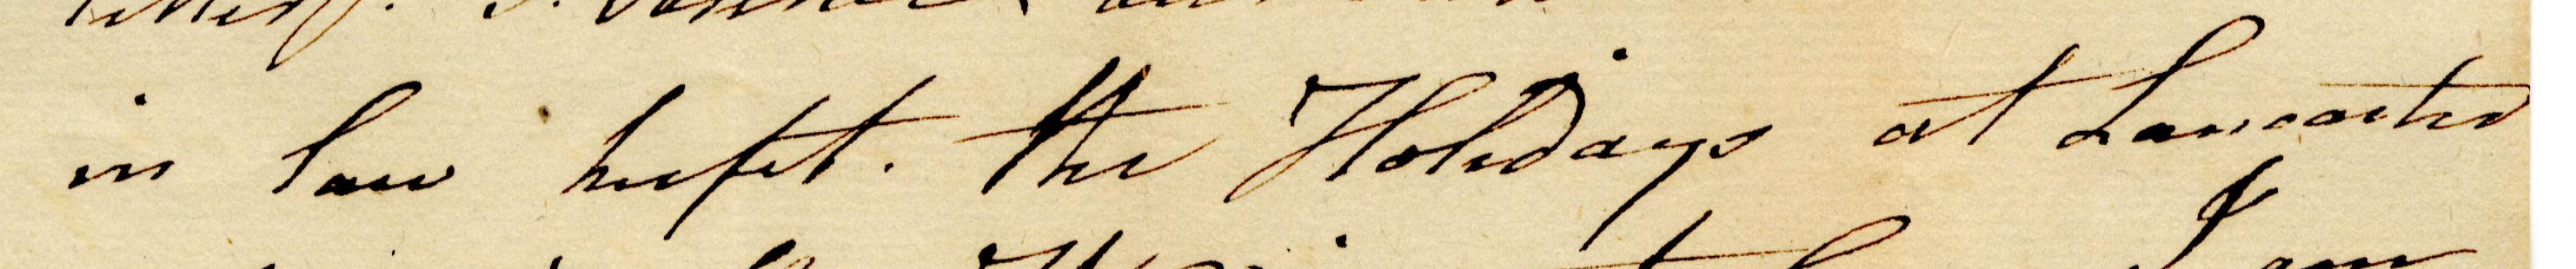in law kept. the Holidays at Lancaster
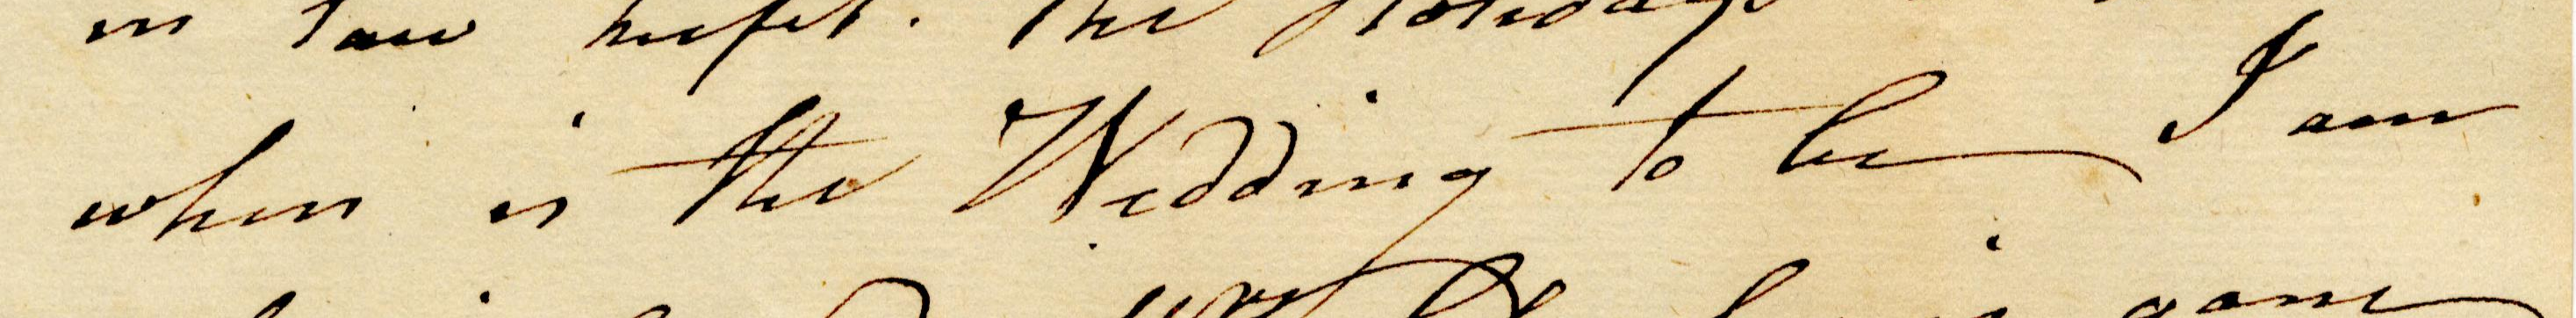when is the Wedding to be- I am
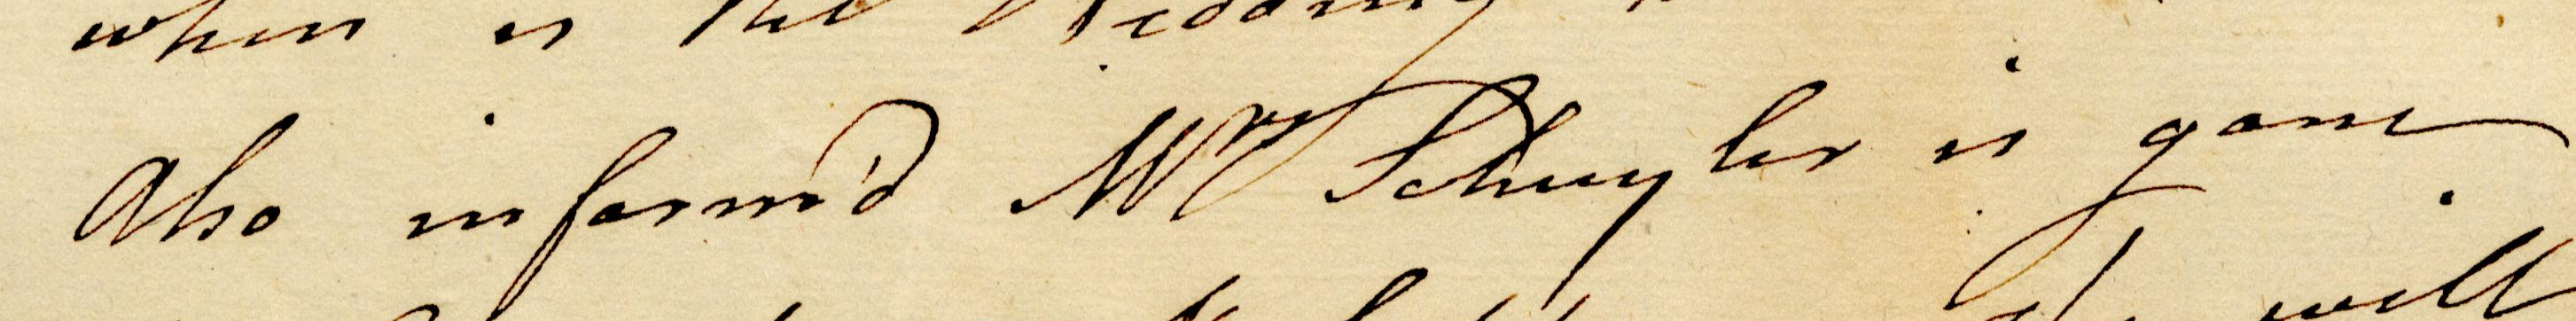also inform'd M^rs Schuyler is gone
